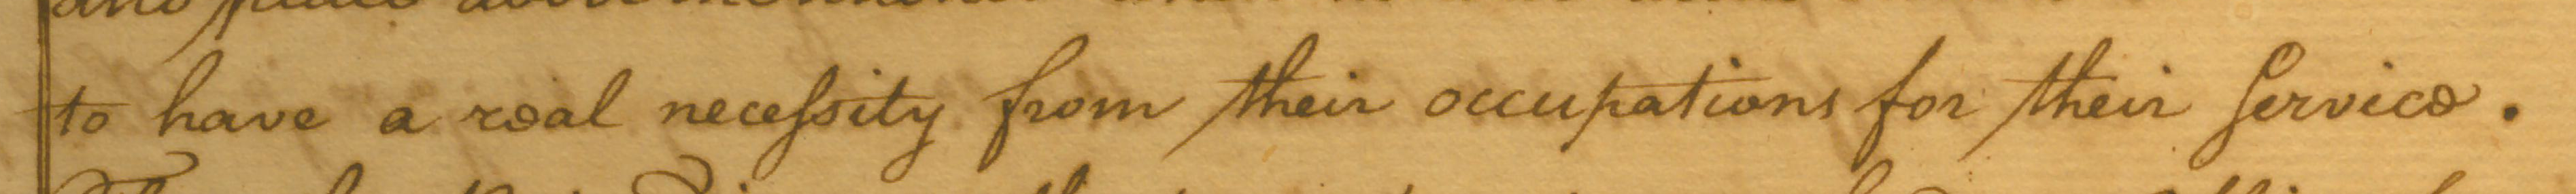to have a real necessity from their occupations for their service.
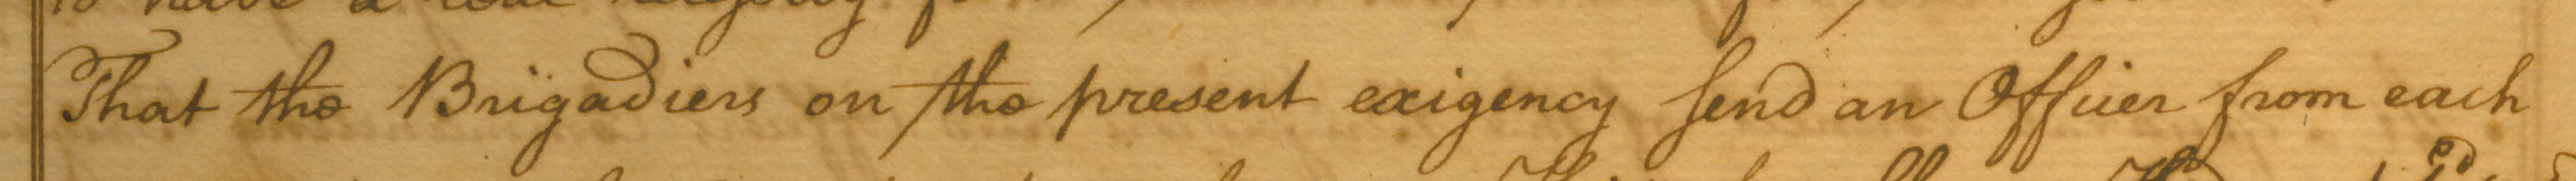That the Brigadiers on the present exigency send an Officer from each
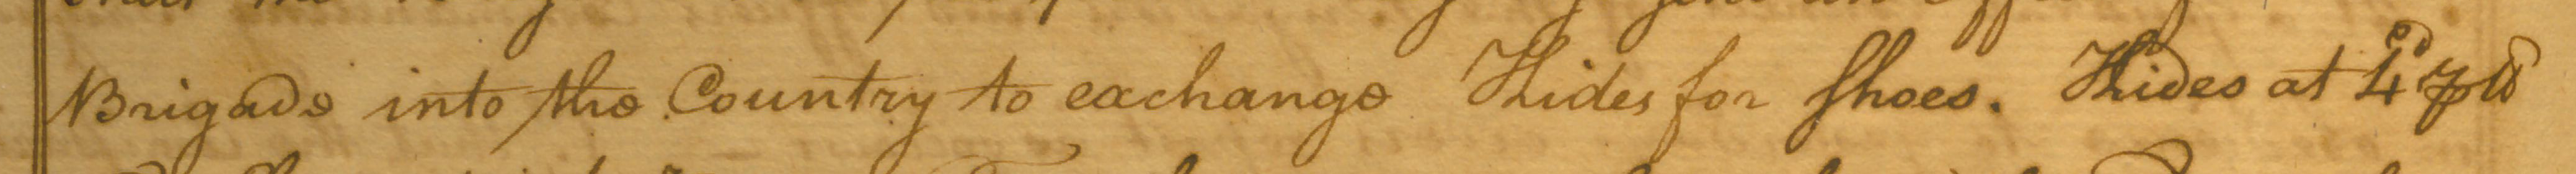Brigade into the Country to exchange Hides for Shoes. Hides at 4^d. per lb
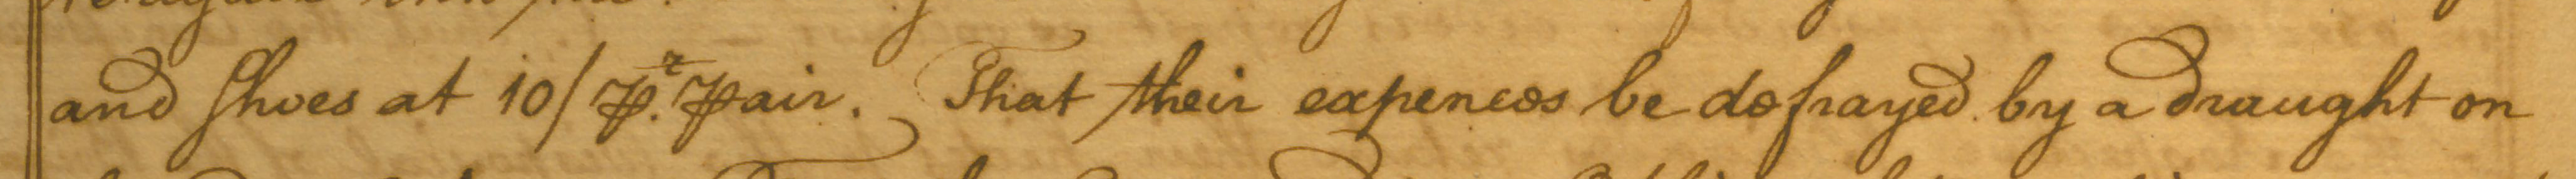and shoes at 10s per pair. That their expences be defrayed by a draught on
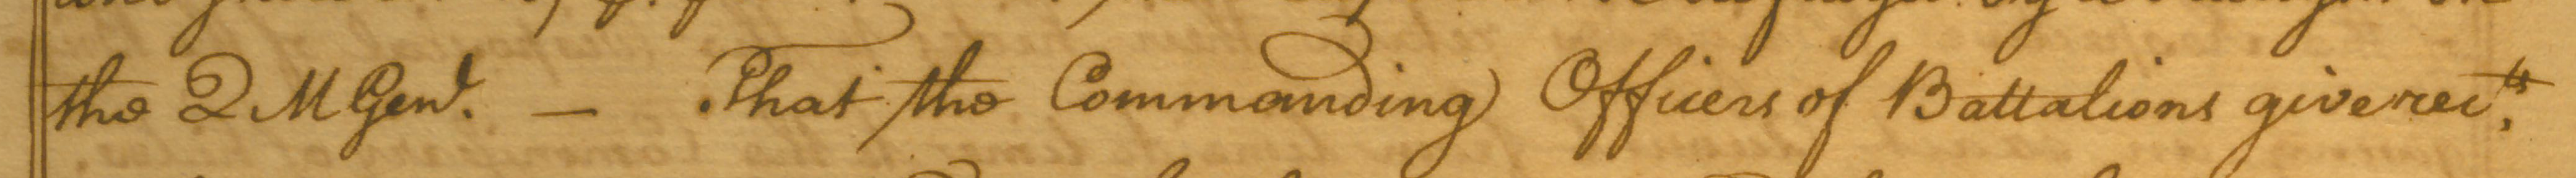the QMGen^l.- That the Commanding Officers of Battalions give rec^ts.
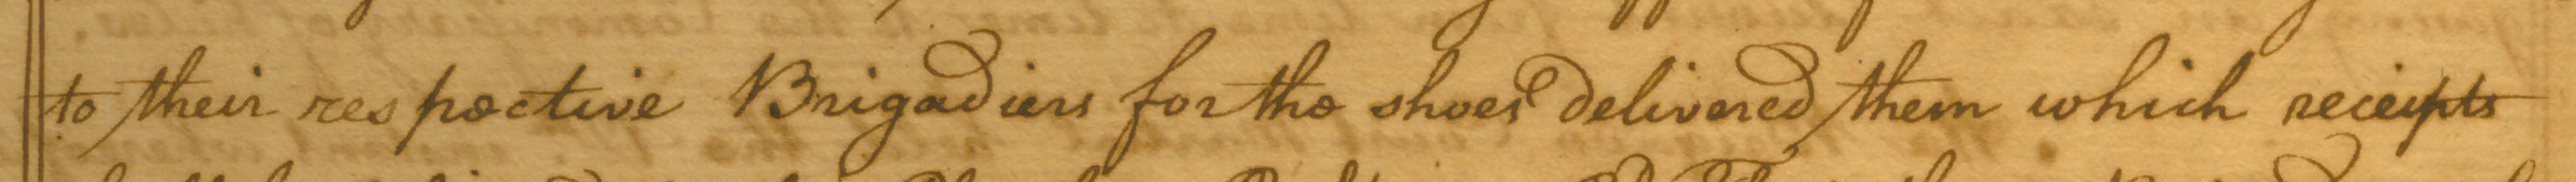to their respective Brigadiers for the shoes delivered them which receipts
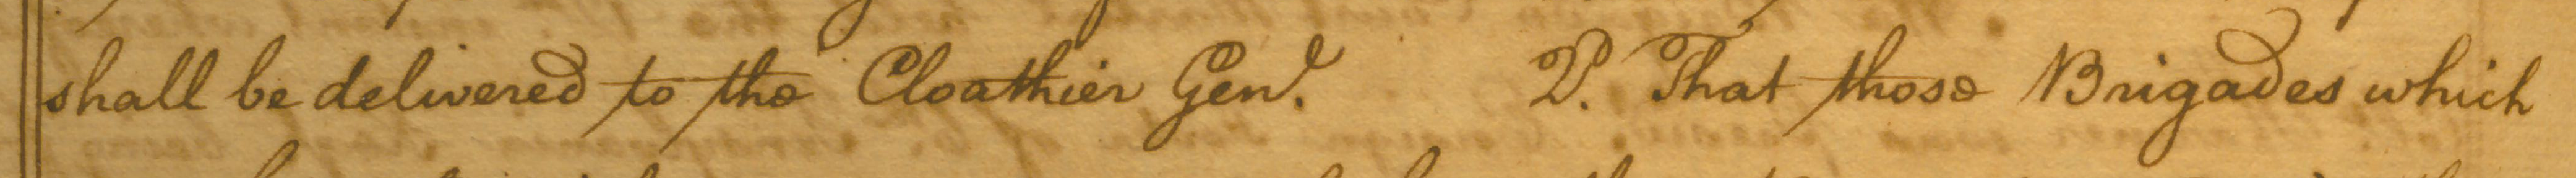shall be delivered to the Cloathier Gen^l. 2^d. That those Brigades which
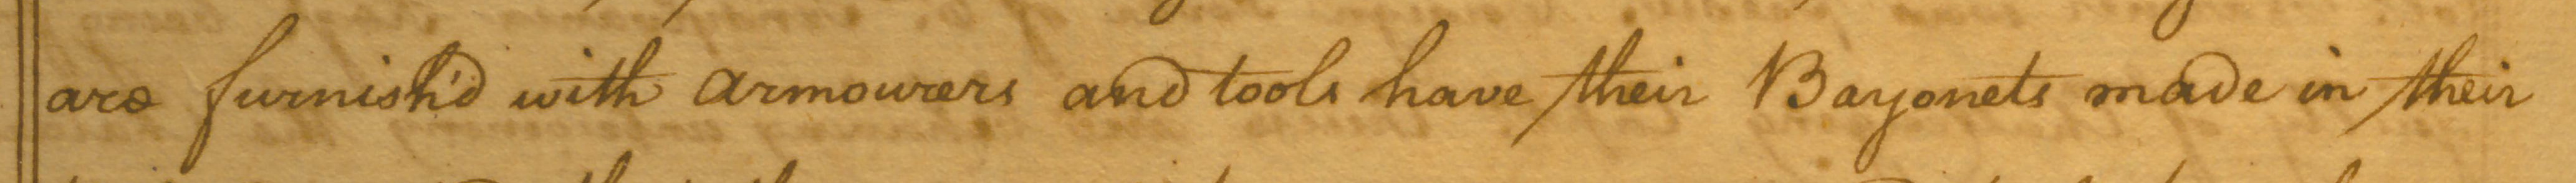are furnish'd with armourers and tools have their Bayonets made in their
